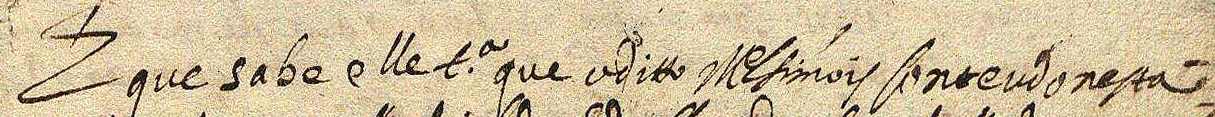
E que sabe elle t.a que o ditto Mel simõis Conteudo nesta
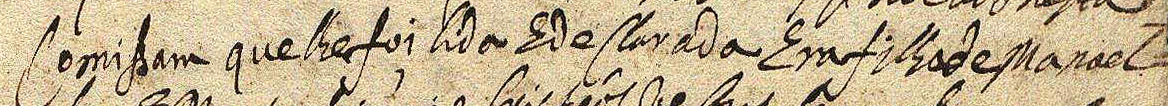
Comissam que lhe foi lida E declarada era filho de Manoel
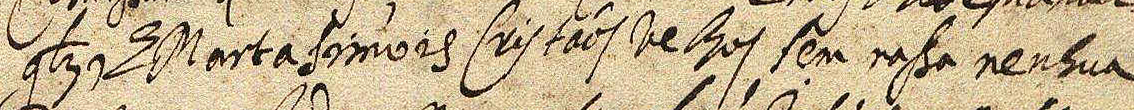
gl̄z, E Marta Simõis Cristaõs velhos sem rassa nenhua
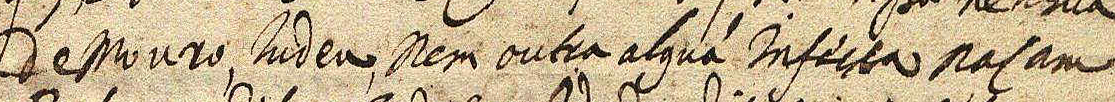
de mouro, Iudeu, nem outra alguā Infecta naCam
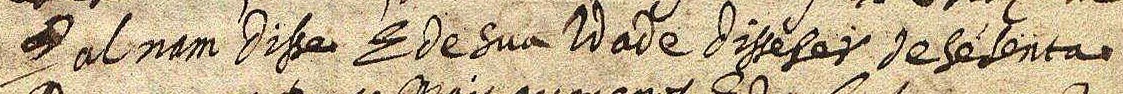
E al nam disse E de sua Idade disse ser de sesenta
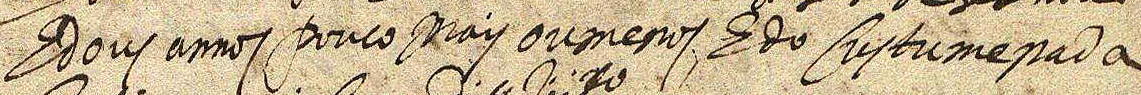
E dous annos pouco mais ou menos, E do Custume nada
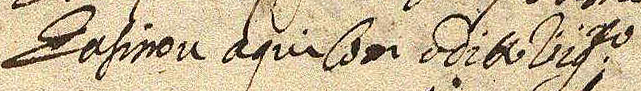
E asinou aqui com o ditto vig.ro
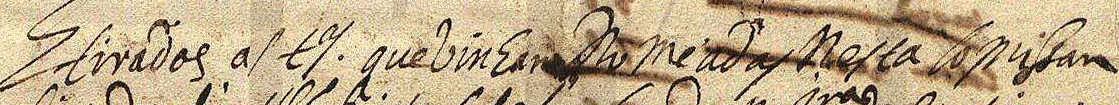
E tiradas as tas. que vinham nomeadas nesta comissam
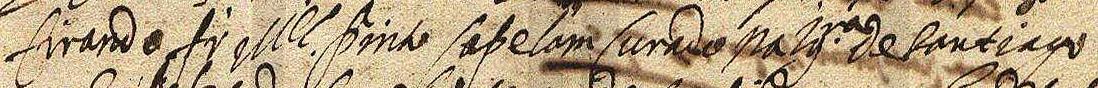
tirando fr Mel pinto Capelam Curado na Igr.a de santiago
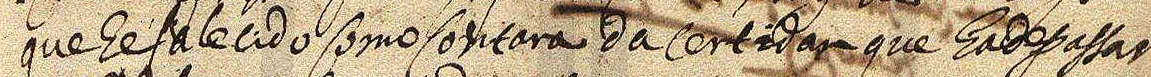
que he falecido Como Contara da certidam que ha de passar
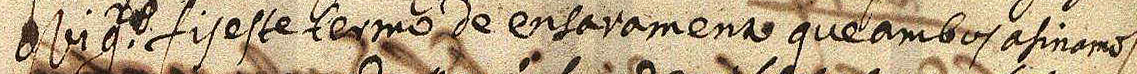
o vig.ro fis este termo de ensaramento que ambos asinamos
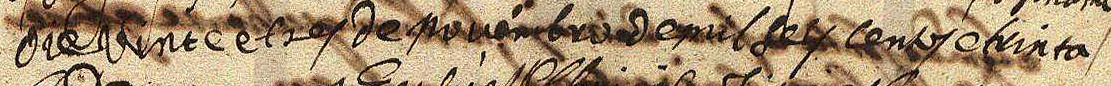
oie vinte e tres de nouembro de mil seiscentos e trinta
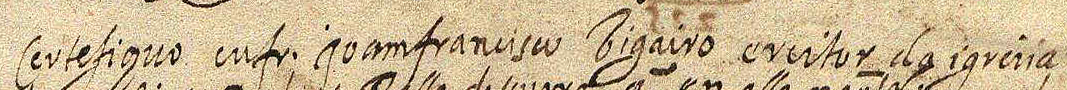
Certefiquo eu fr. Joam francisco Vigairo e reitor da igreiia
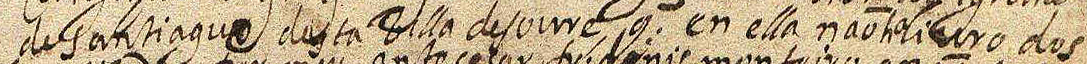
de Santiaguo desta villa de soure, q̄ en ella naõ ha liuro dos
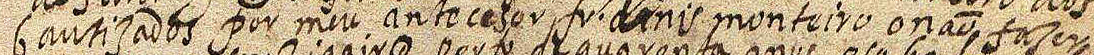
bautizados por meu antecesor, fr. dinis monteiro o naõ fazer
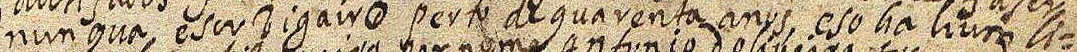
nunqua e ser vigairo perto de quarenta anos, e so ha liuro li
